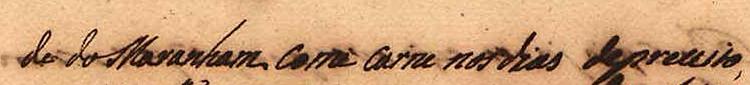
de do Maranham come carne nos dias de preceito,
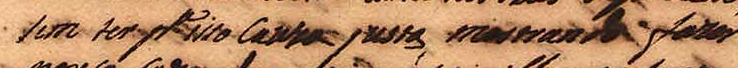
sem ter p.a isso cauza justa, mostrando fazer
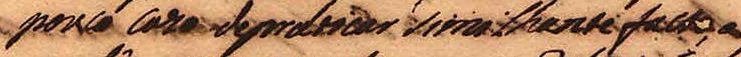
pouco cazo de praticar similhante facto, o
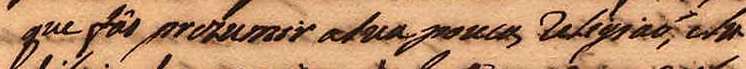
que fás prezumir a sua pouca Religiaõ, e Iu
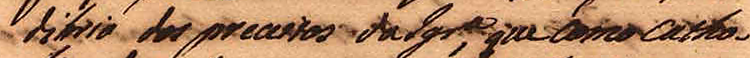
dibrio dos preceitos da Igr.a, que como catho
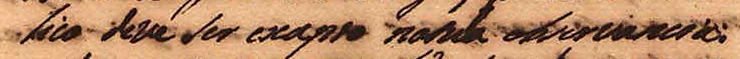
lico deve ser exapto na sua observancia:
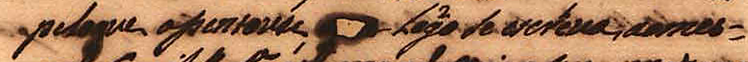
pelo que assentouse, _ Logo se escreua, ao mes
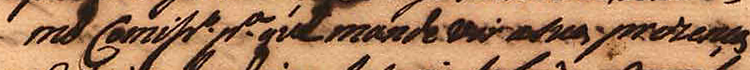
mo Comisr.o p.a que mande vir a sua prezença
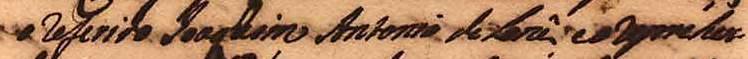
o Referido Ioaquim Antonio de Loné, e o Reprehen
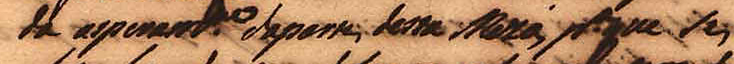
da asperam.te da parte desta Meza, p.a que se
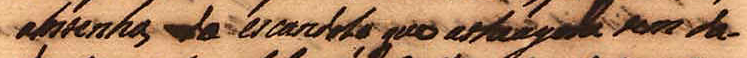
abstenha do escandolo, que athe agora tem da
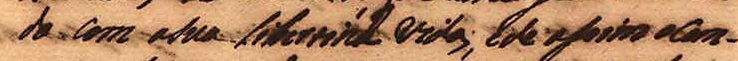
do com a sua libertina vida; e de assim o com
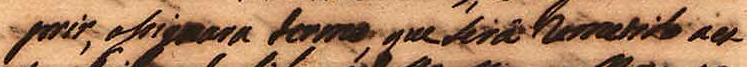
prir, assignara termo, que será Remetido a es
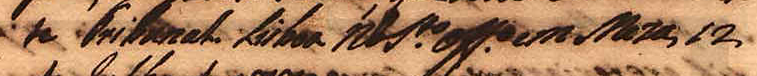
te Tribunal. Lisboa no s.to off.o em Meza 12
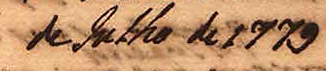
de Iulho de 1779
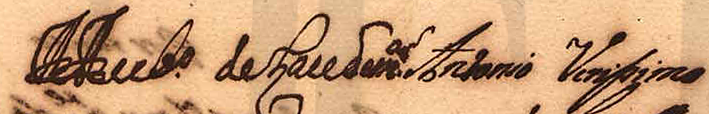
ARceb.o de Lacedem.a Antonio Verissimo
